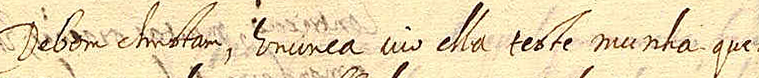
De bom christam, E nunca uio ella testemunha que
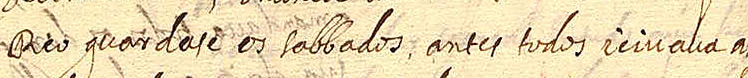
Reo guardase os sabbados, antes todos ieiuaua a
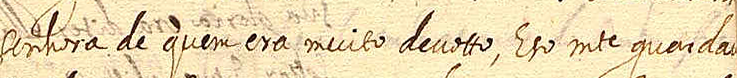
Senhora de quem era muito deuotto, E somte guarda
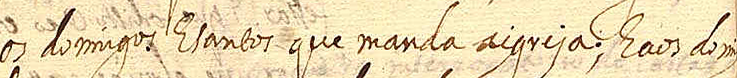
os domingos E santos que manda a igreja; E aos domi
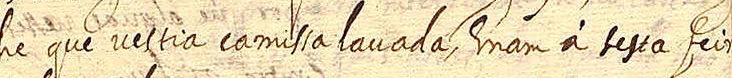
he que uestia camissa lauada, E nam à sesta feir
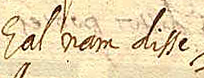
E al nam disse
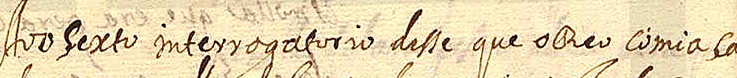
Aoo Sexto interrogatorio disse que o Reo comia ca
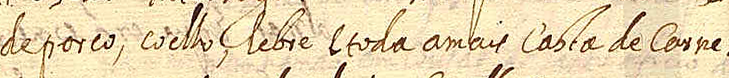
de porco, coelho, lebre e toda a mais Casta de Carne
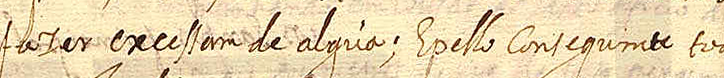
fazer excessam de algūa; E pello conseguinte to
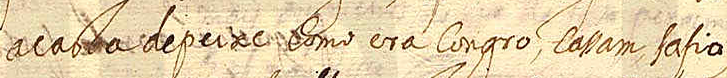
a casta de peixe Como era Congro, cassam, Safio,
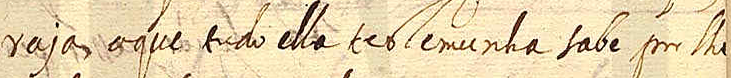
raja o que tudo ella testemunha sabe por lhe
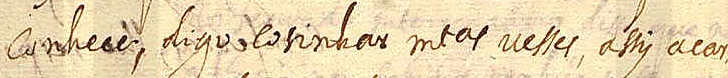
Conhecer, digo cosinhar mtas uesses, assy a car
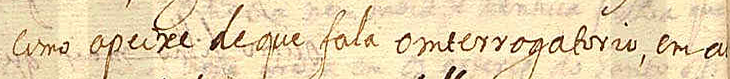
como o peixe de que fala o interrogatorio, em a
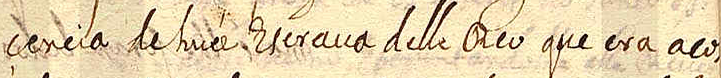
çencia de huā Escraua delle Reo que era a co
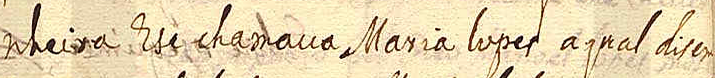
nheira E se chamaua Maria lopes a qual disem
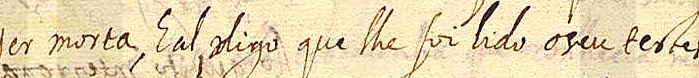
ser morta, E al, digo que lhe foi lido o seu teste
